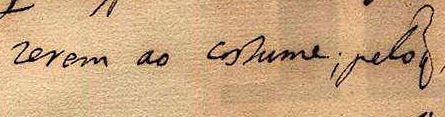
zerem ao costume; pelo q̄,
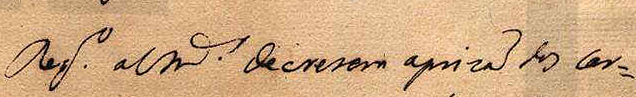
Req.o a vm.es decretem a prizaõ dos car
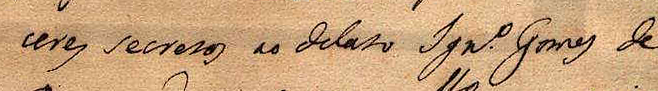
ceres secretos ao delato Ign.o Gomes de
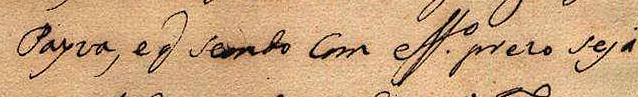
Payva, e q̄ semdo Com eff.o prezo seja
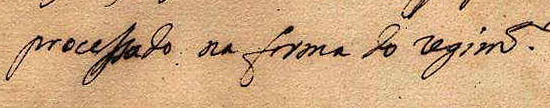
processado na forma do regim.to
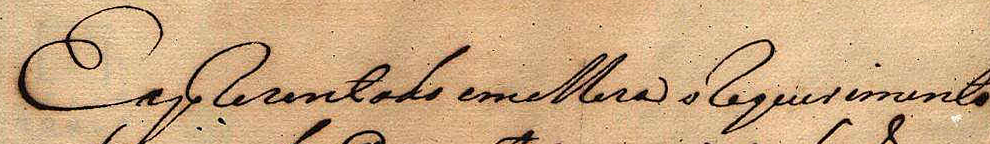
E apRezentado em Meza o Requerimento
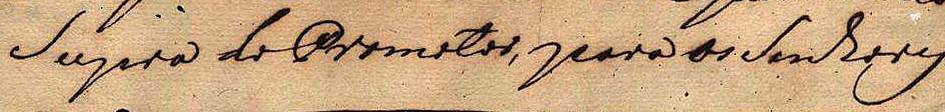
Supra do Promotor, para os Senhores
